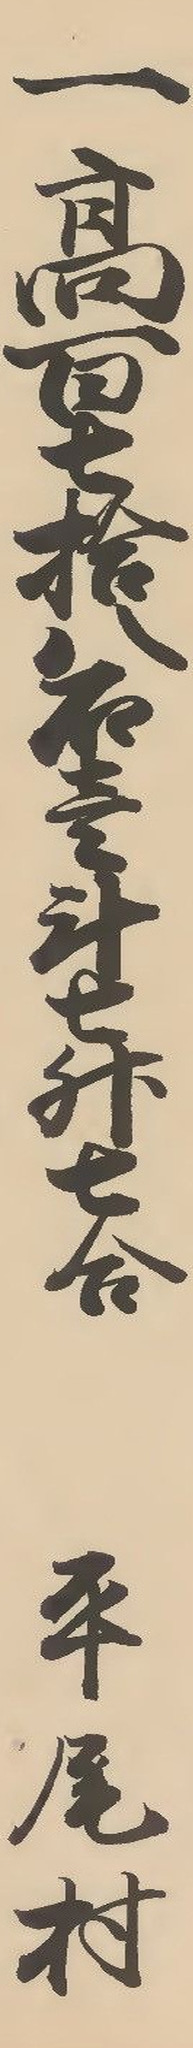一髙百七拾八石壱斗七升七合平尾村
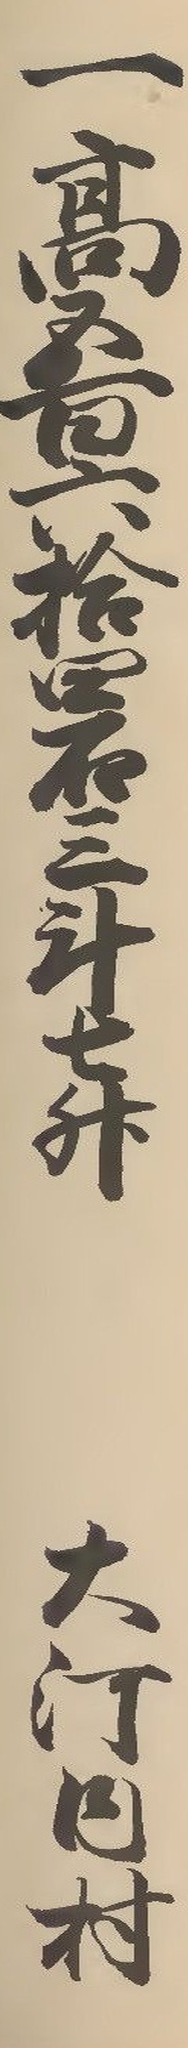一髙五百六拾四石三斗七升大河内村
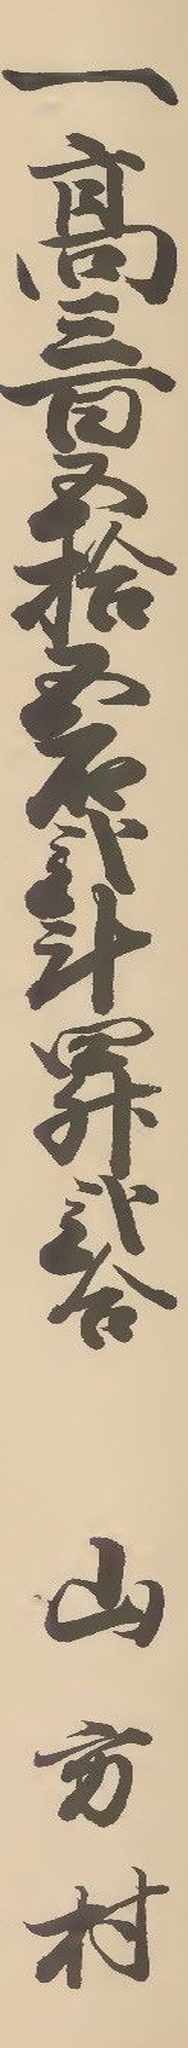一髙三百五拾五石弐斗四升弐合山方村
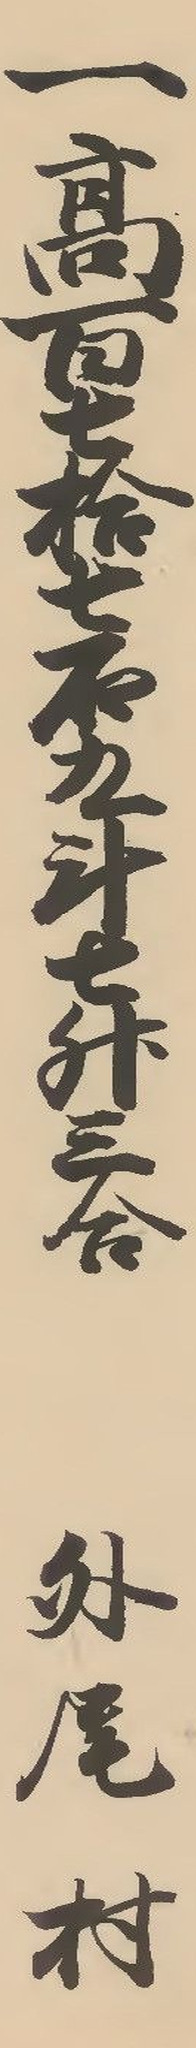一髙百七拾七石九斗七升三合外尾村
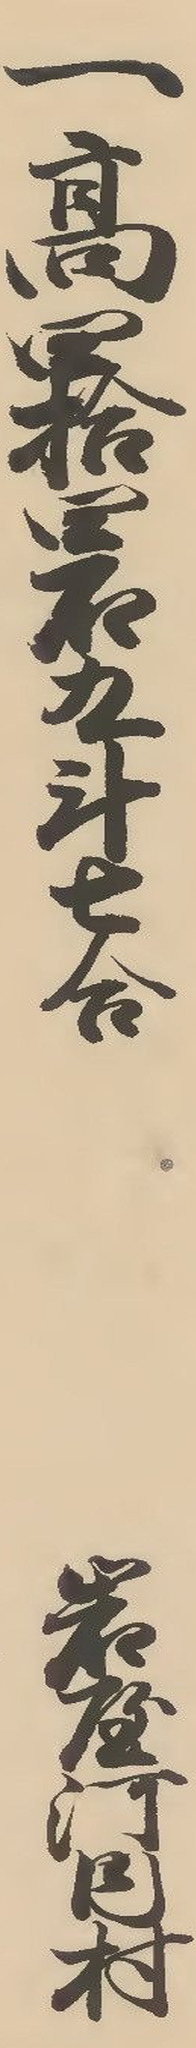一髙四拾四石九斗七合岩屋河内村
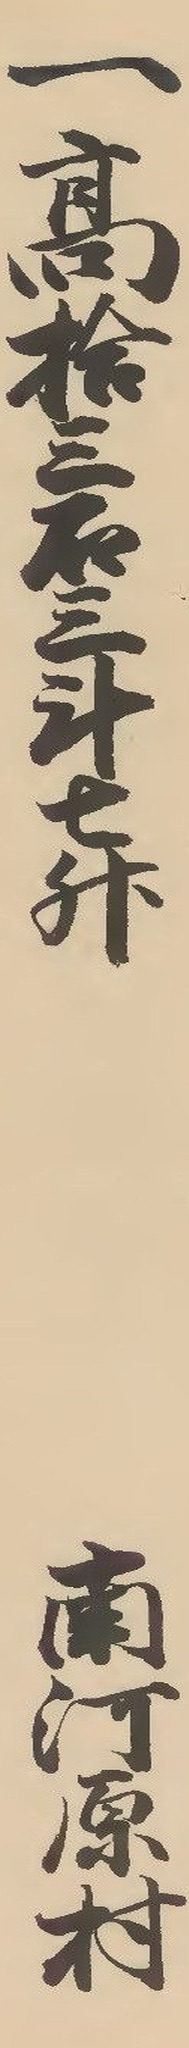一髙拾三石三斗七升南河原村

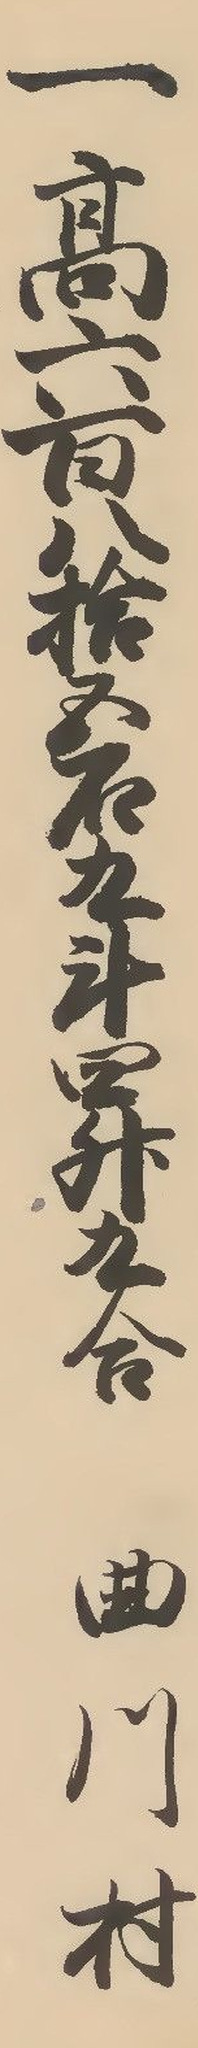一髙六百八拾五石九斗四升九合曲川村
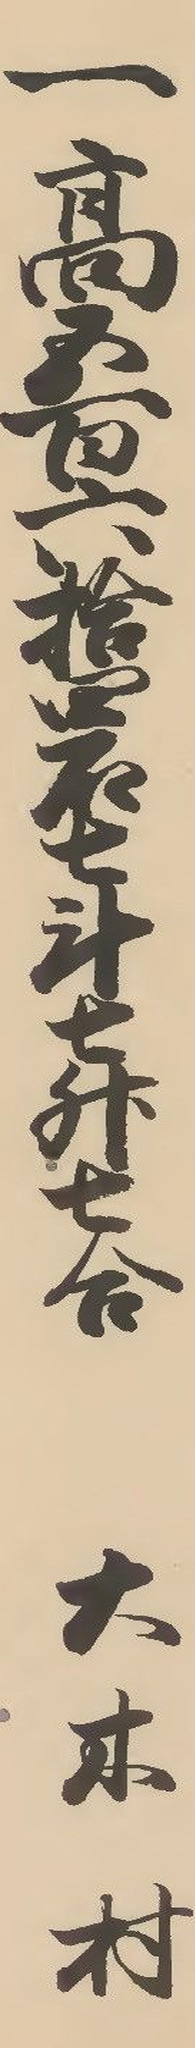一髙五百六拾四石七斗七升七合大木村
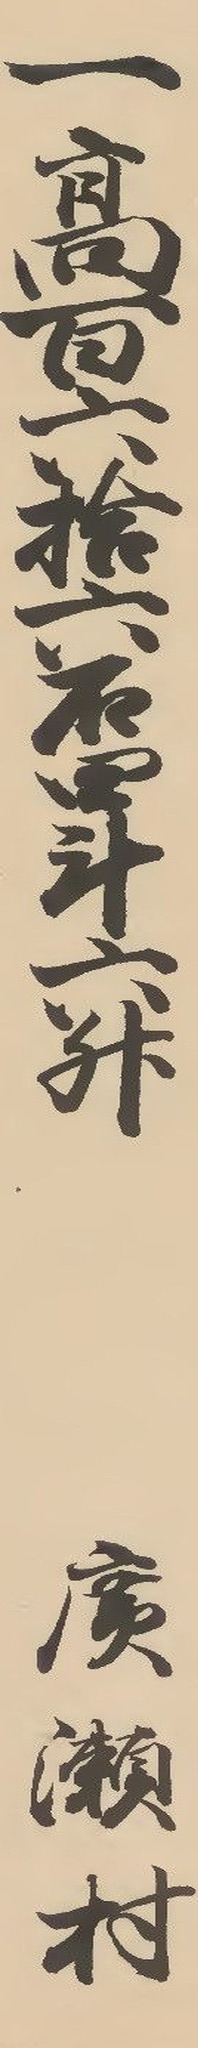一髙百六拾六石四斗六升廣瀬村
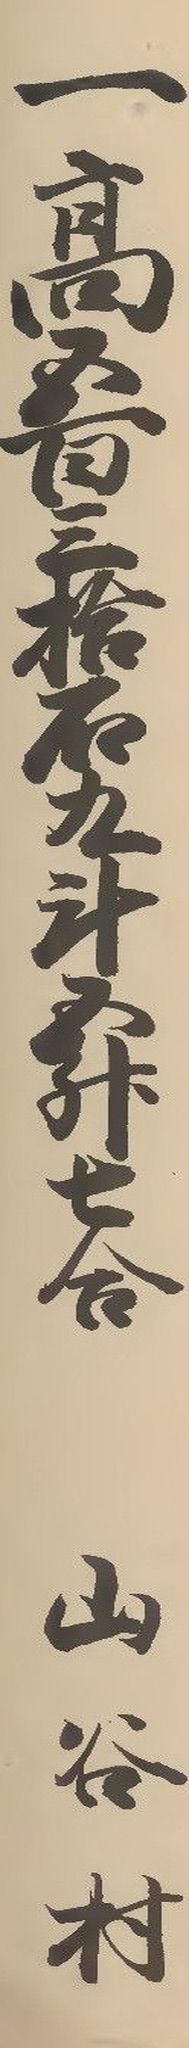一髙五百三拾石九斗五升七合山谷村
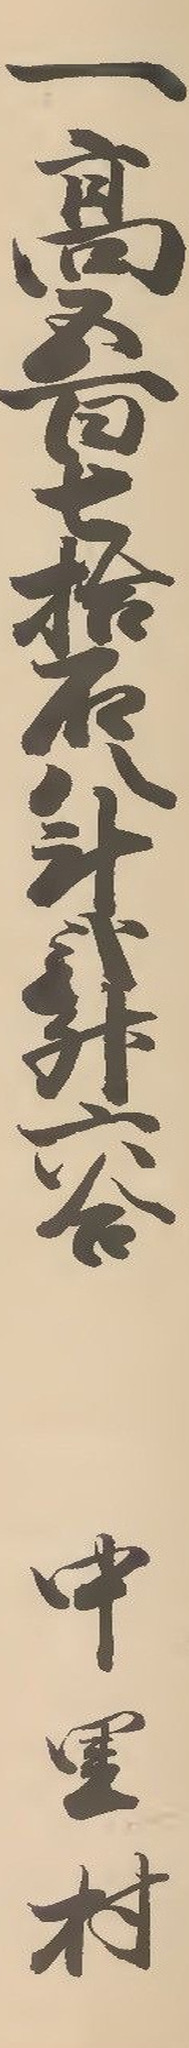一髙五百七拾石八斗弐升六合中里村
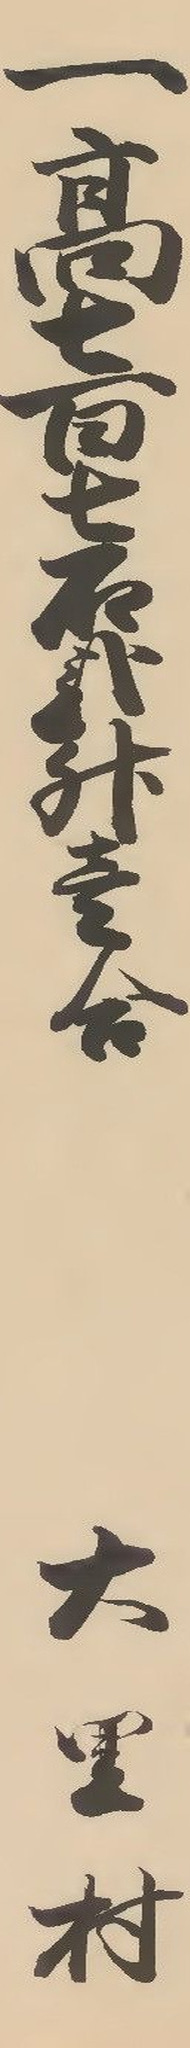一髙七百七石弐升壱合大里村
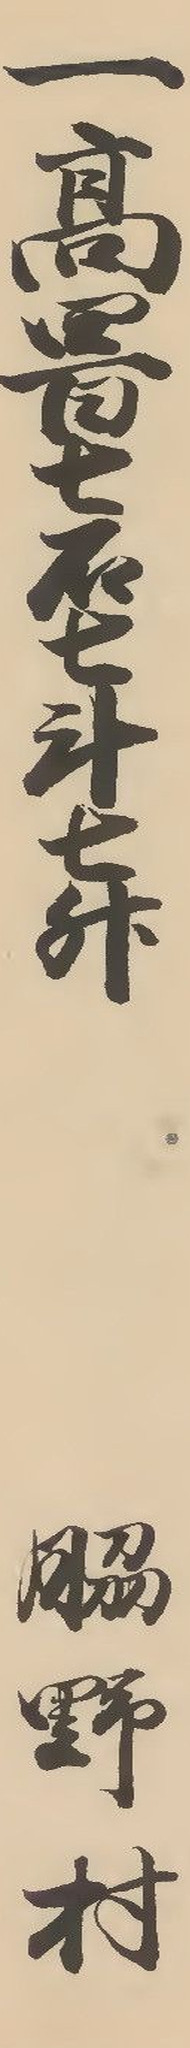一髙四百七石七斗七升脇野村
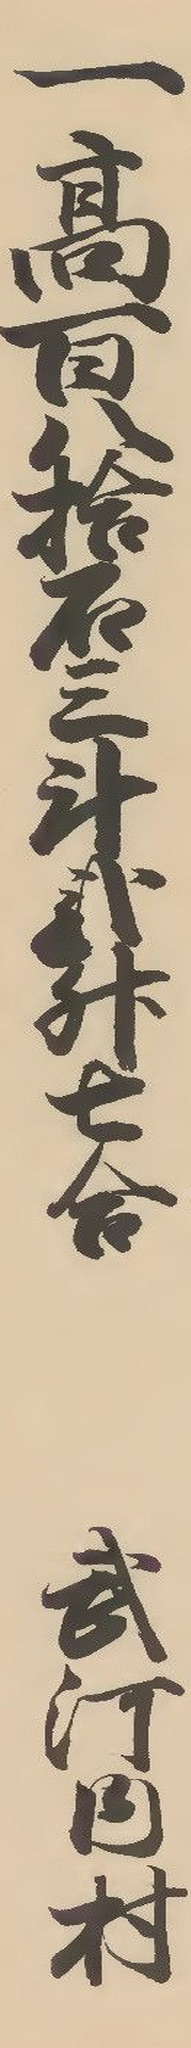一髙百八拾石三斗二升七合武河内村

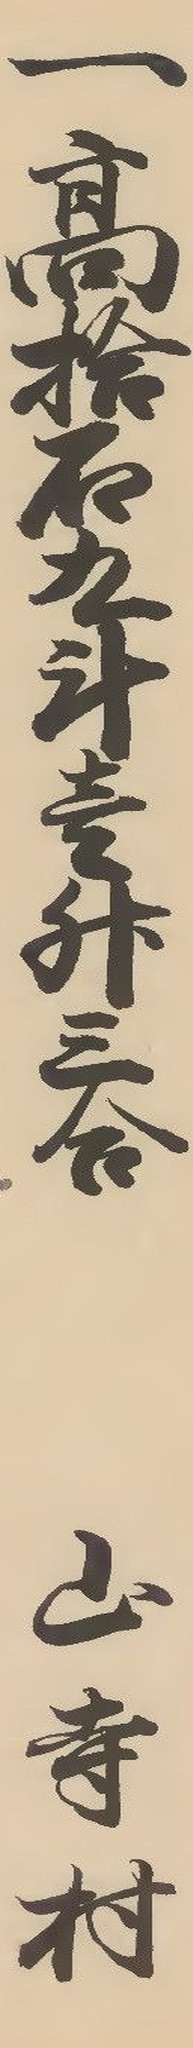一髙拾石九斗壱升三合山寺村
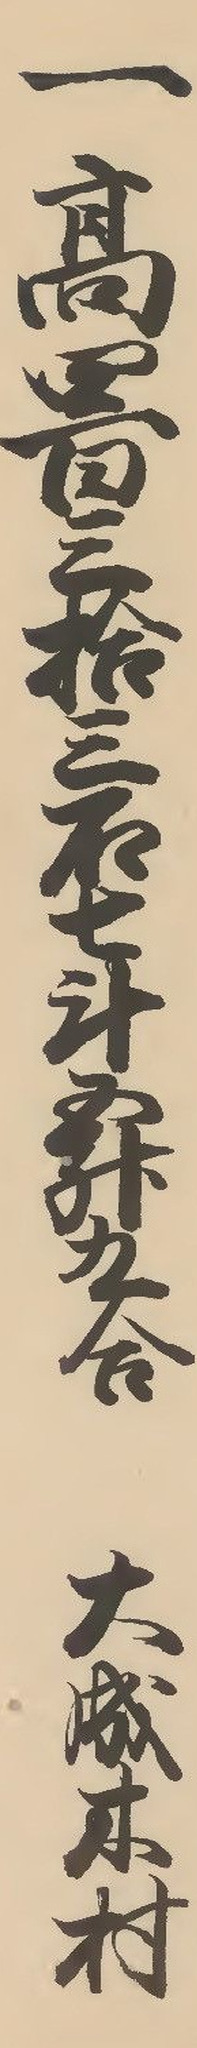一髙四百三拾三石七斗五升九合大成木村
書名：肥前国郷帳
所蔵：国立公文書館 National Archives of Japan
